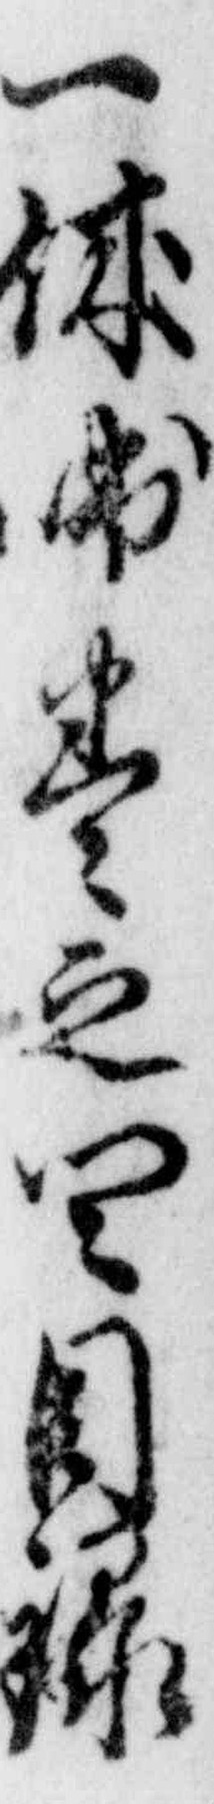一休咄壱之四目録
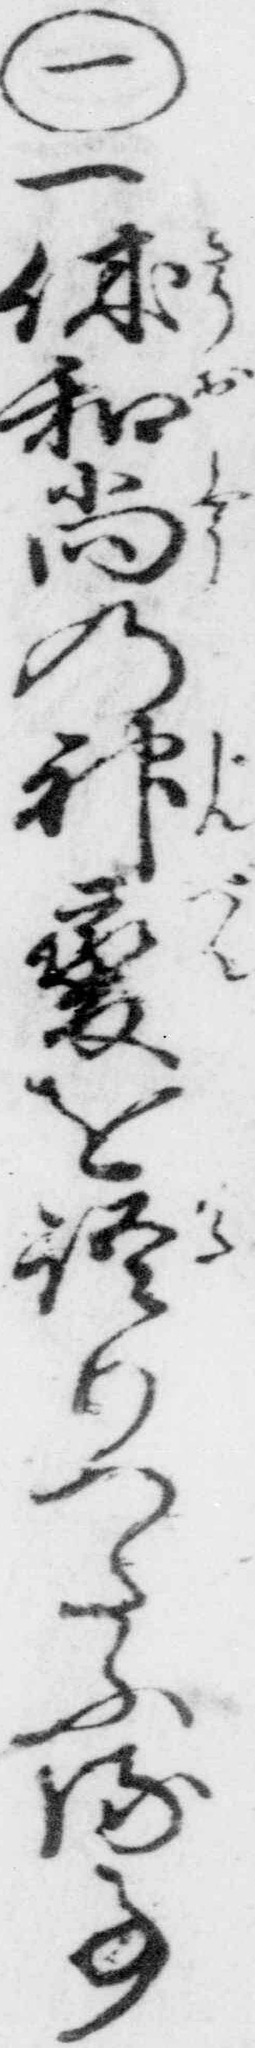一一休和尚の神変を語りつたふる事
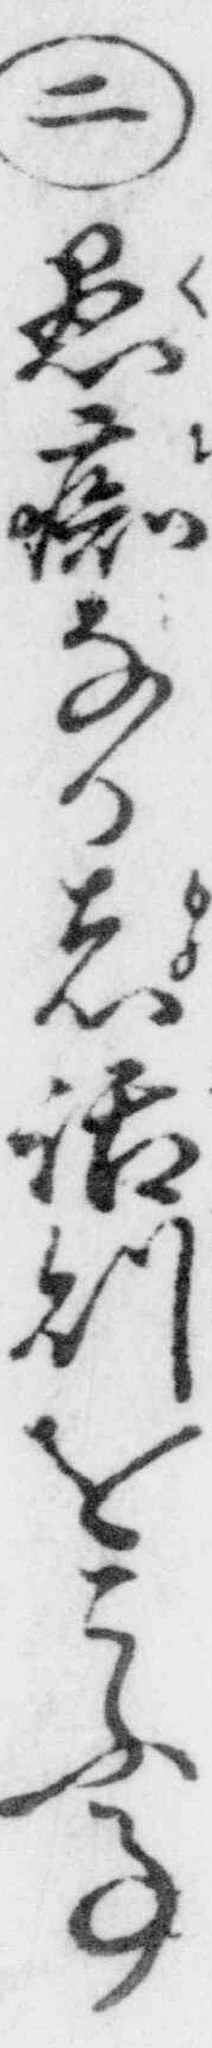二愚痴なる者話則をこふ事
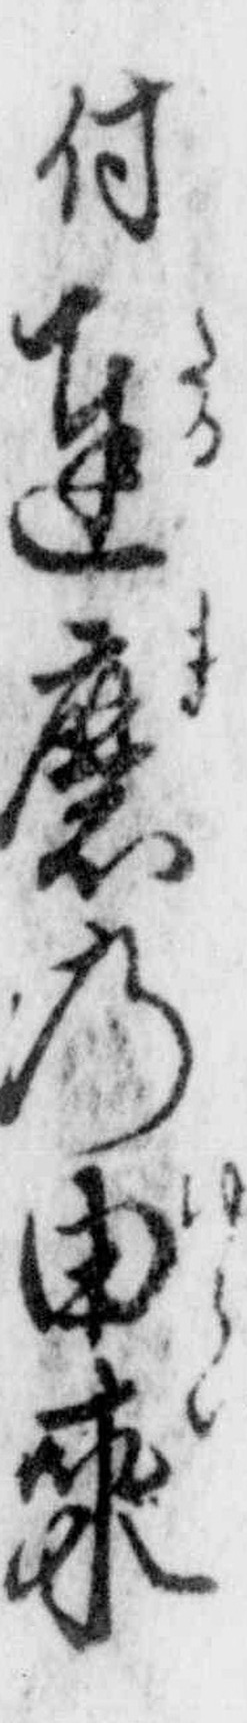付達磨の由来
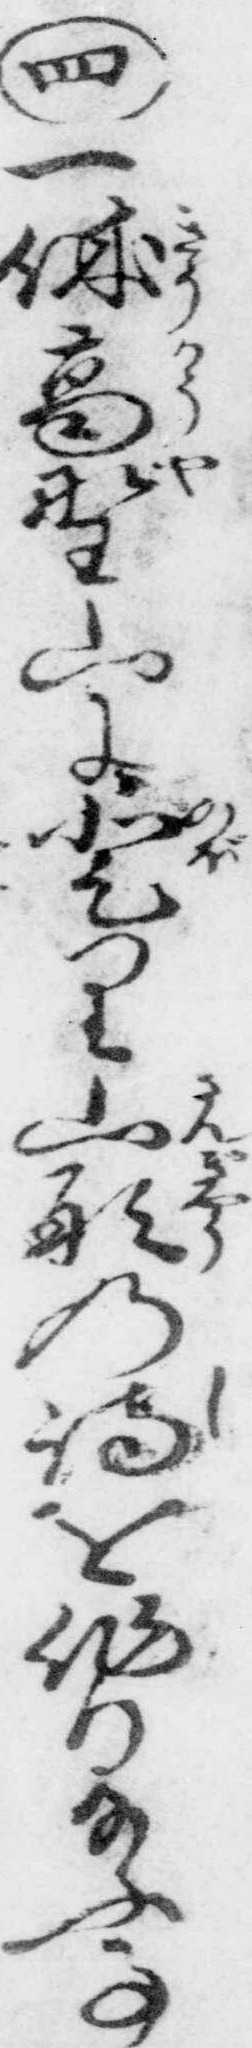四一休高野山に登り山形の詩を作り給ふ事
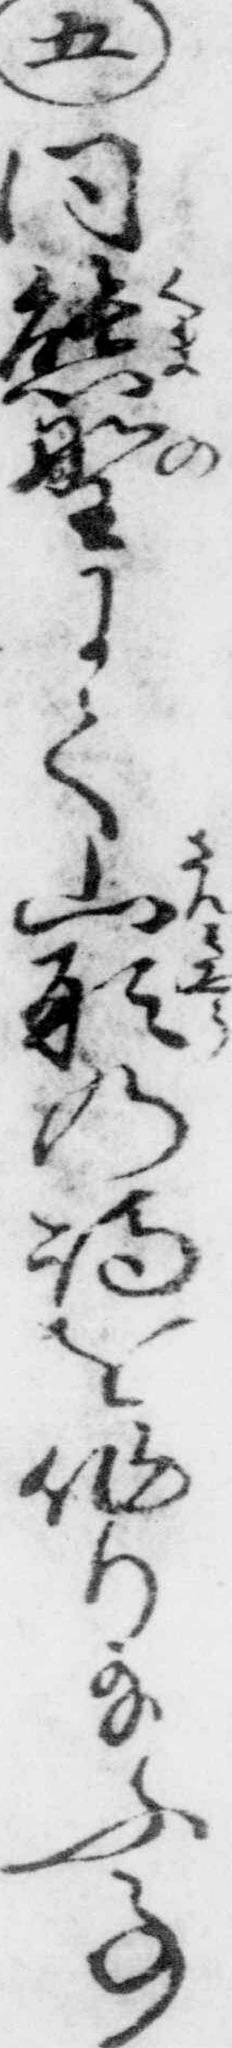五同熊野にて山形の詩を作り給ふ事
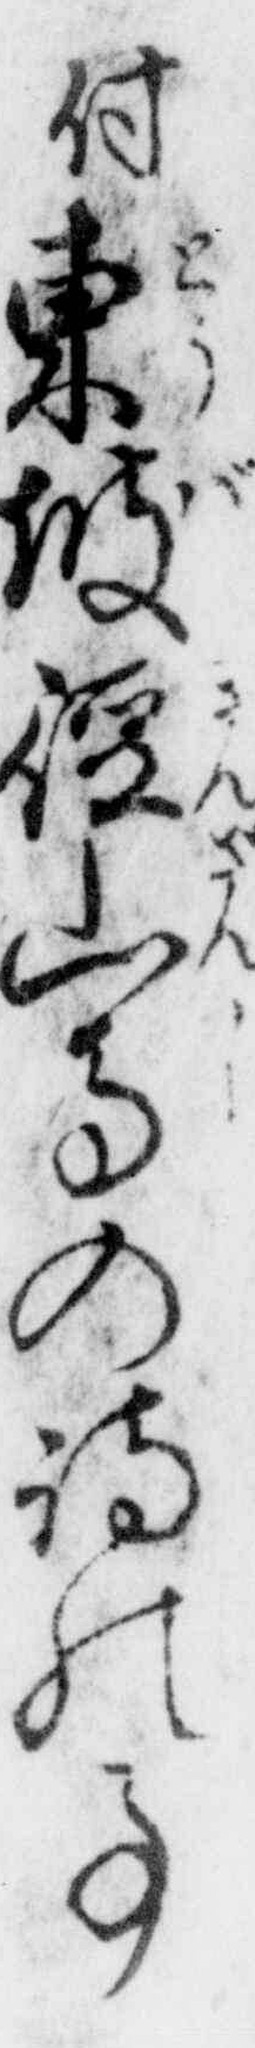付東坡径山寺の詩の事
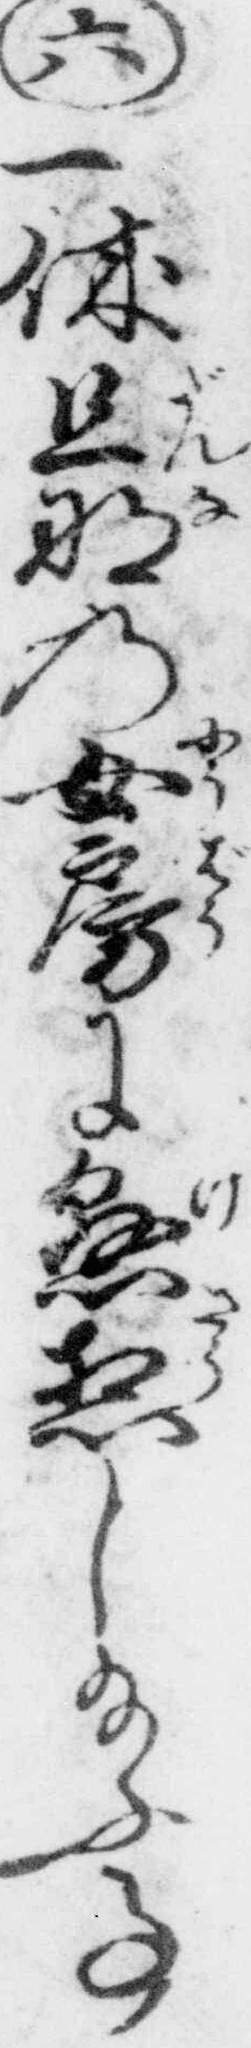六一休旦那の女房に懸想し給ふ事
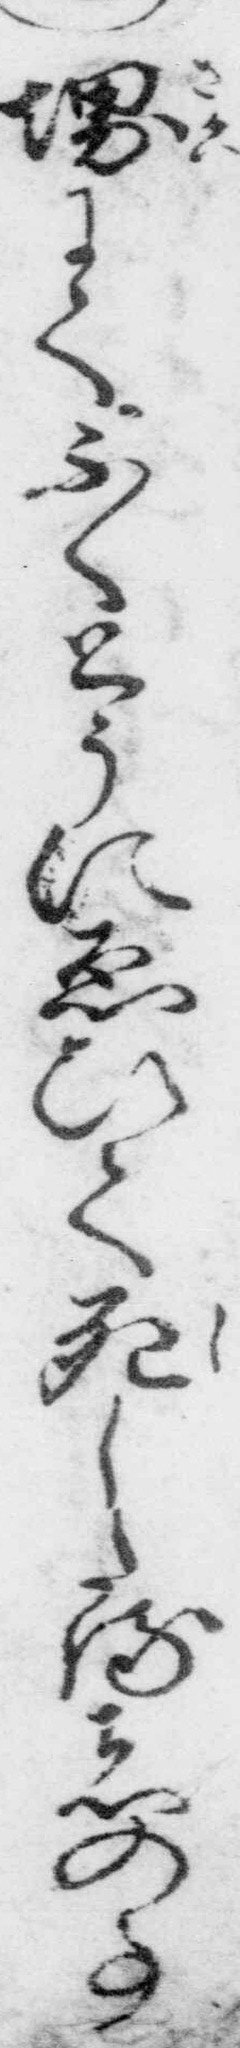七堺にてふくとうにゑひて死したるしの事
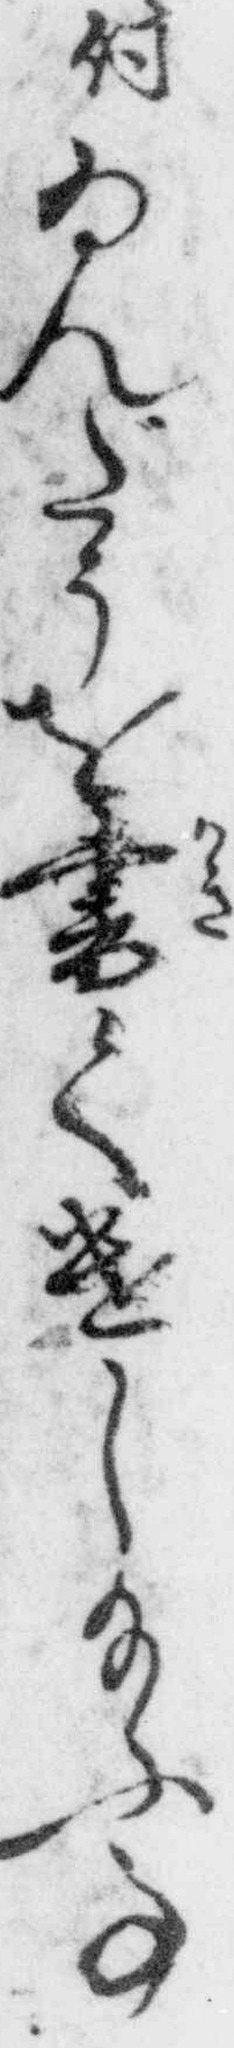付ゐんだうを書て遣し給ふ事

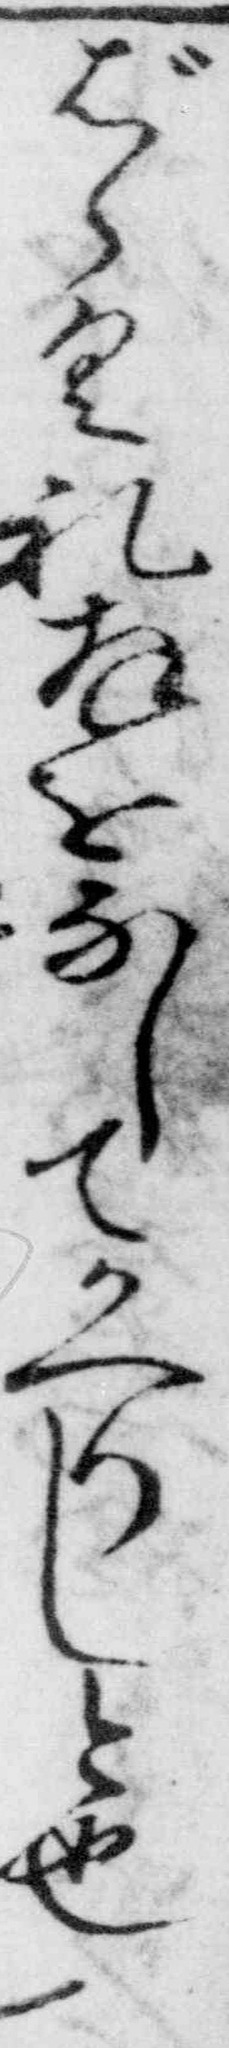ばらく礼拝をなしてかへりしと也
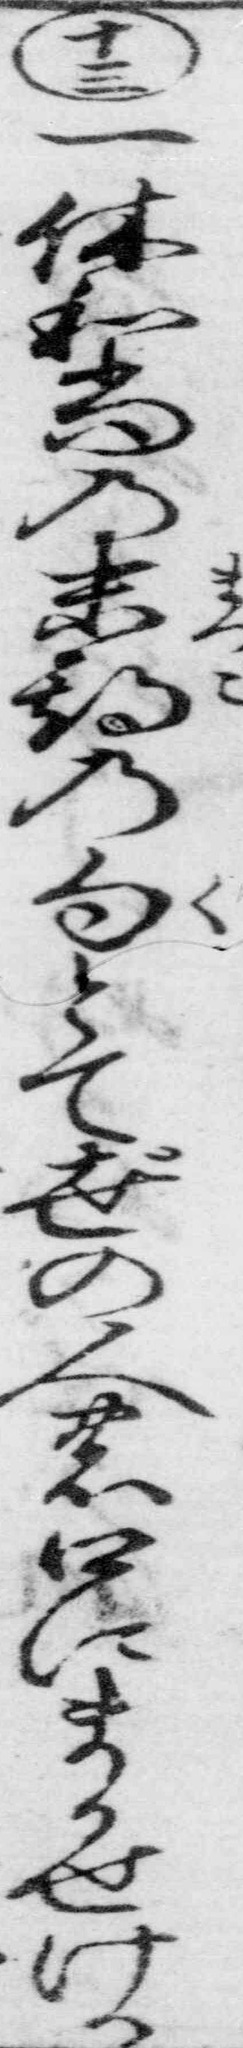一休和尚の末期の句とて。世の世の口にまかせける
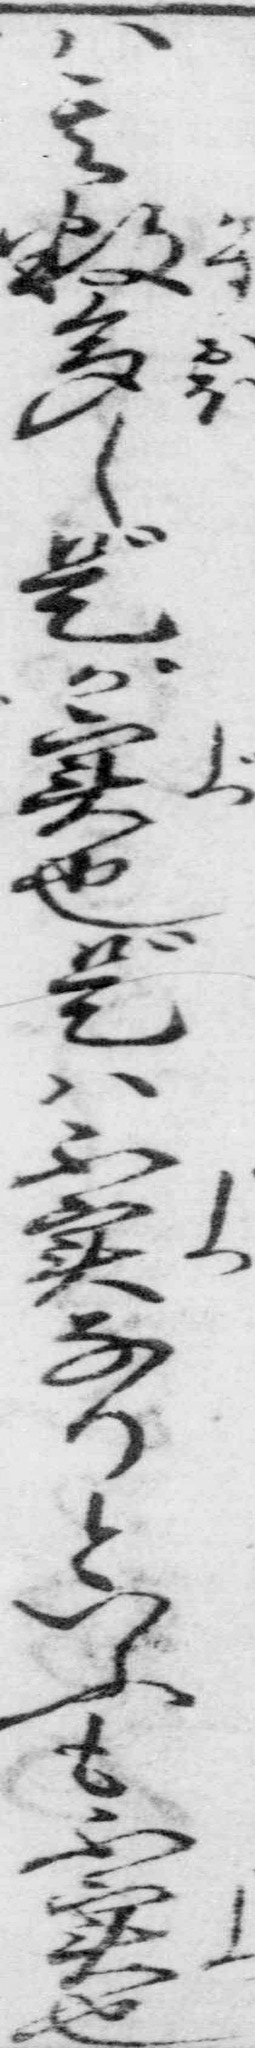は其数多し。是が実也。是は不実なりといふも不実也
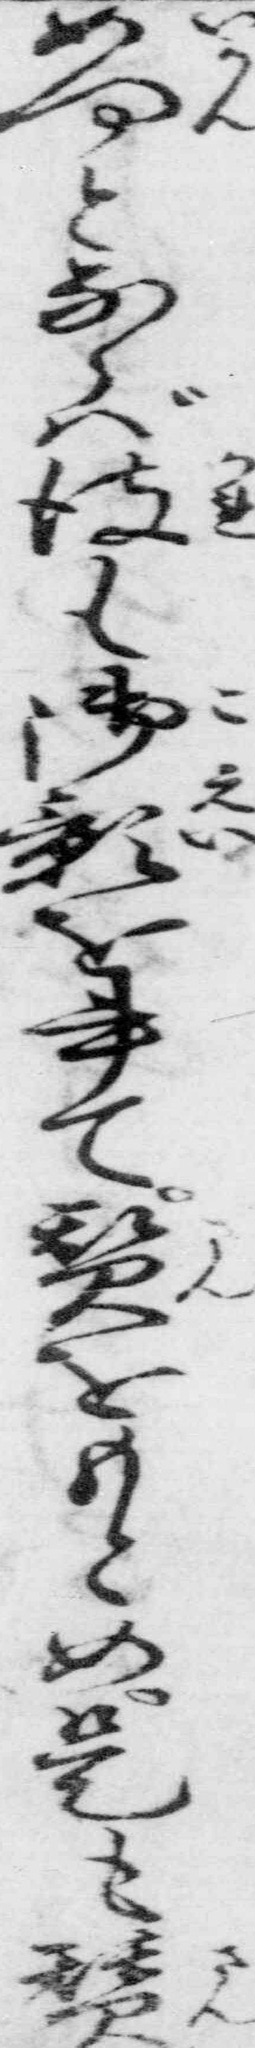如何とならば彼も御影を書て。賛をもとめ。是も替
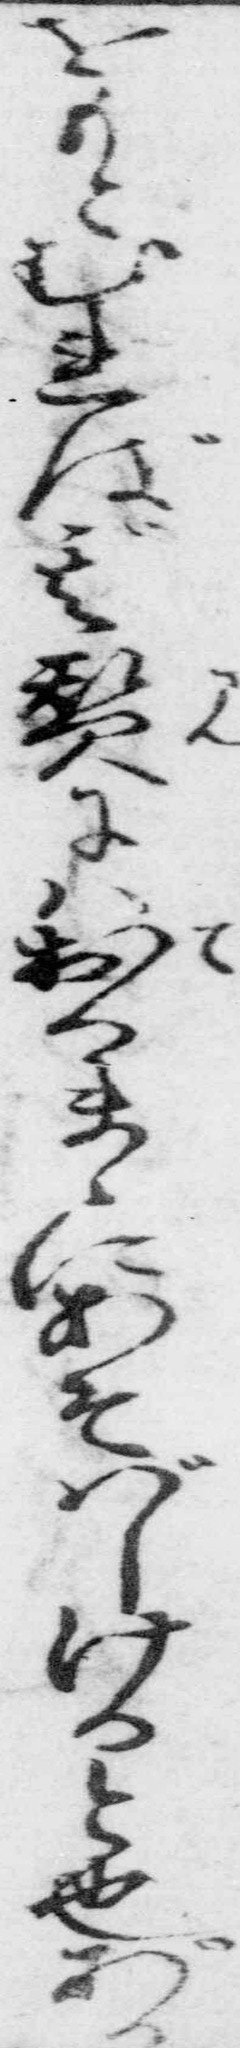をもとむれば。其賛には出るまゝにあそばしけると也。ある
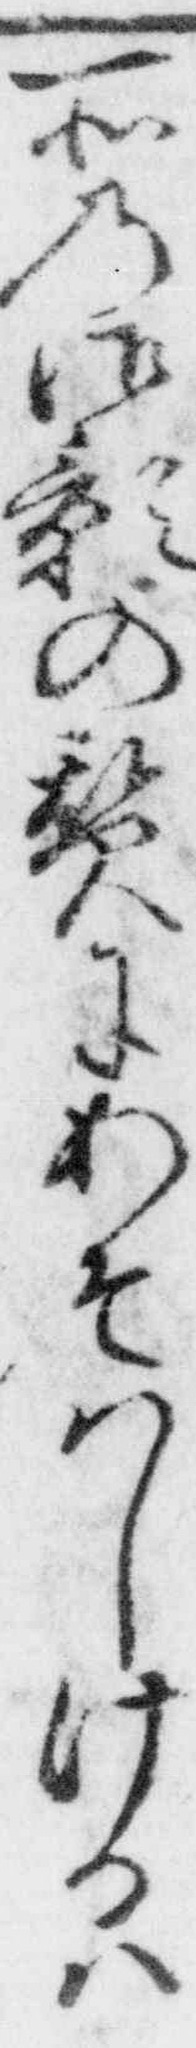所の御影の賛にあそばしけるは
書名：一休はなし（寛文八）
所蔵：名古屋大学附属図書館 国文学研究資料館
